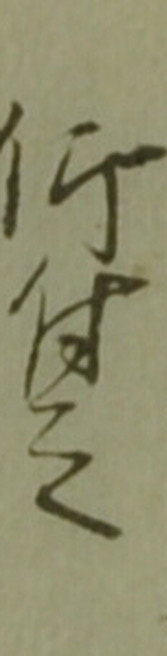仰付之
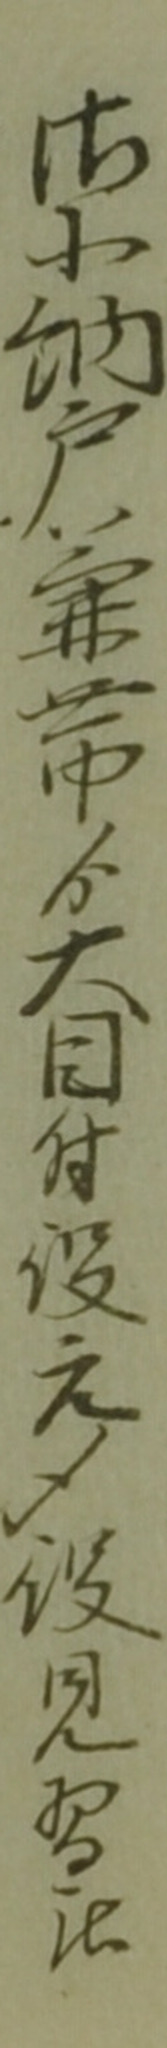御小納戸兼帯ゟ大目付役元〆役見習被
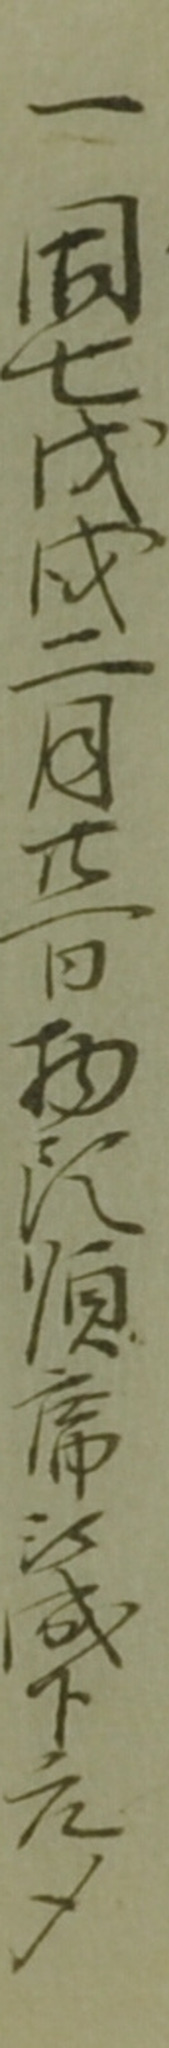一同七戊戌二月廿一日物頭順席被成下元〆
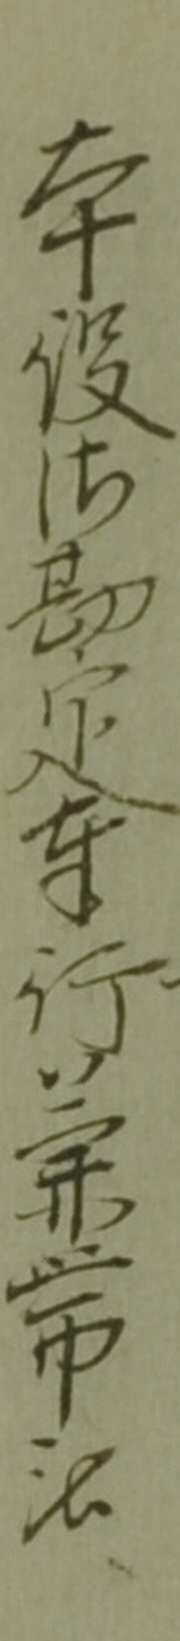本役御勘定奉行兼帯被
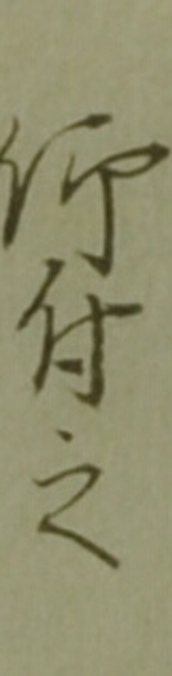仰付之
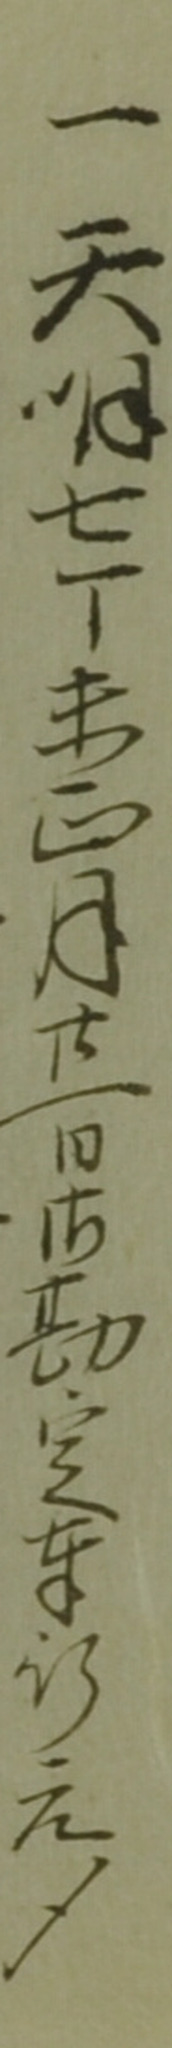一天明七丁未正月廿一日御勘定奉行元〆
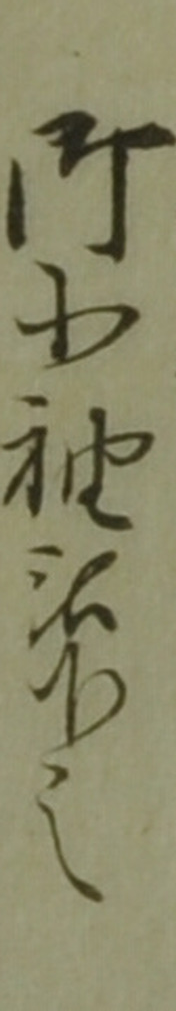御小袖被下之
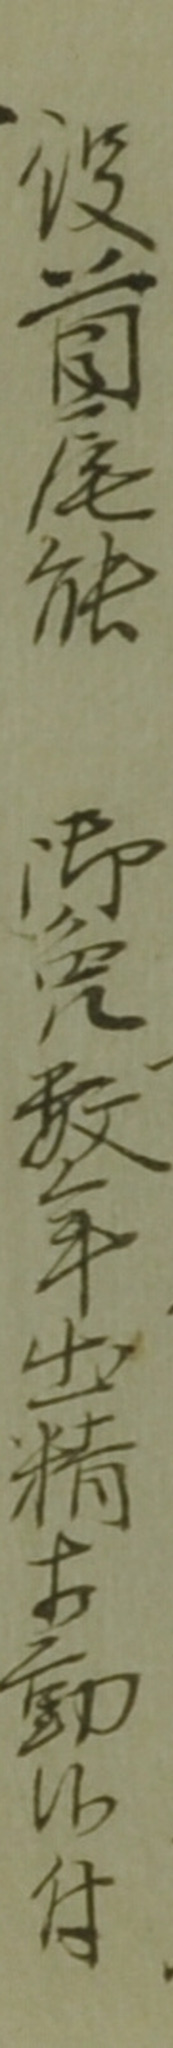役首尾能御免数年出精相勤候付
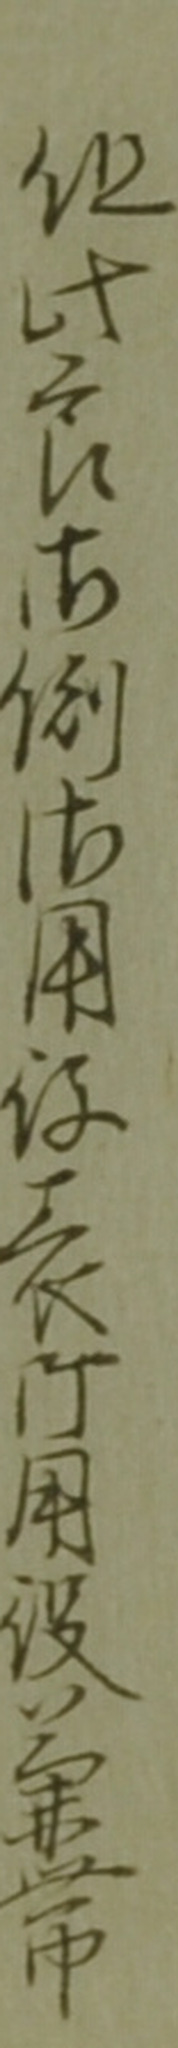但此節御側御用役表御用役兼帯
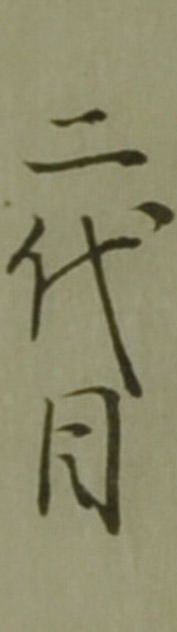二代目
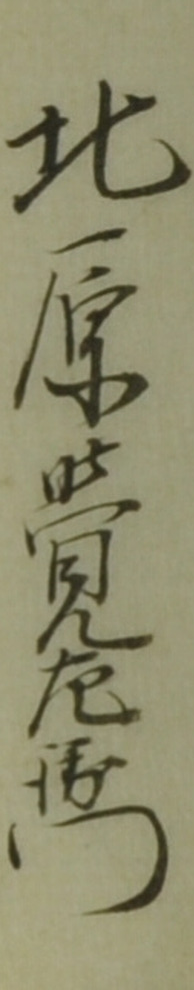北原覚左衛門

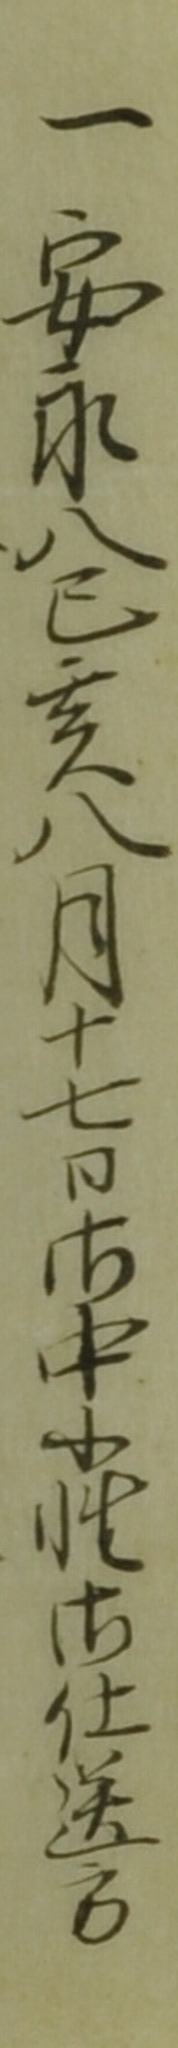一安永八己亥八月十七日御中小性御仕送方
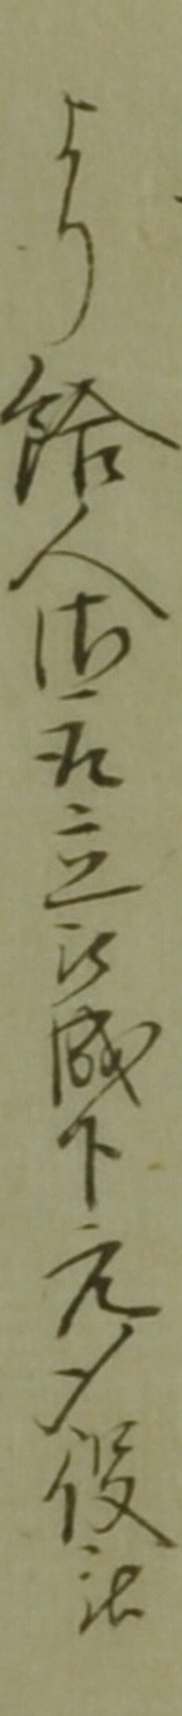より給人御取立被成下元〆役被
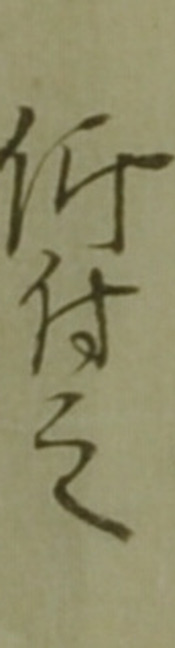仰付之
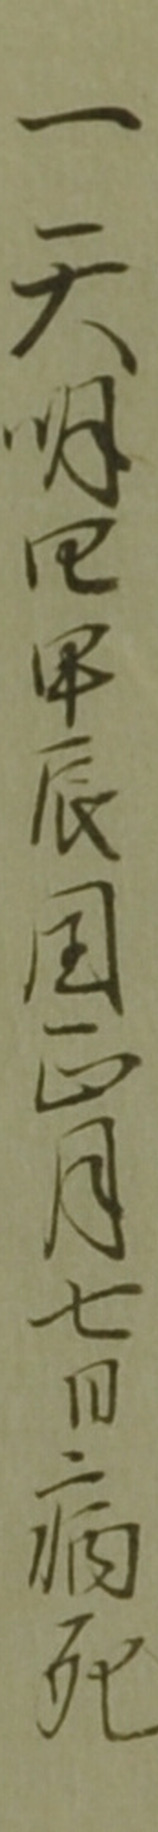一天明四甲辰閏正月七日病死
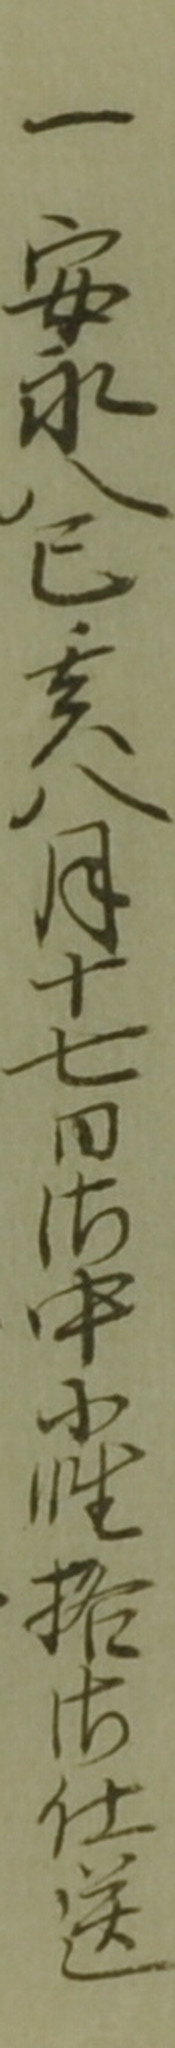一安永八己亥八月十七日御中小性格御仕送
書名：諸御役代々録（七）
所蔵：伊那市立高遠町図書館・合同会社AMANE
